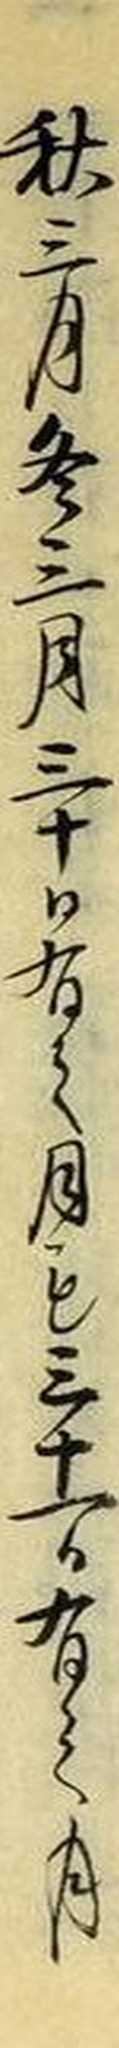秋三月冬三月三十日有之月も三十一日有之月
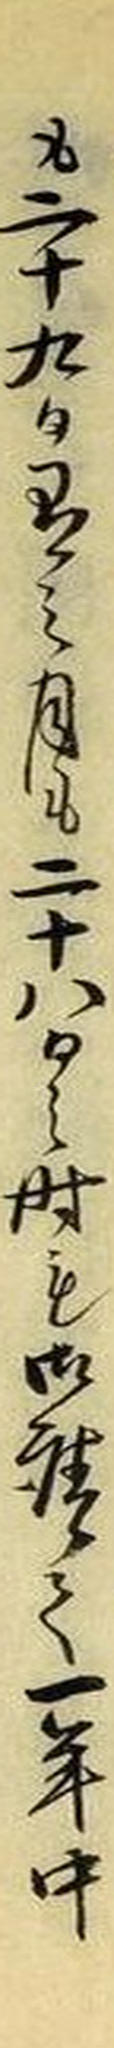も二十九日有之月も二十八日之時も御座候て一年中
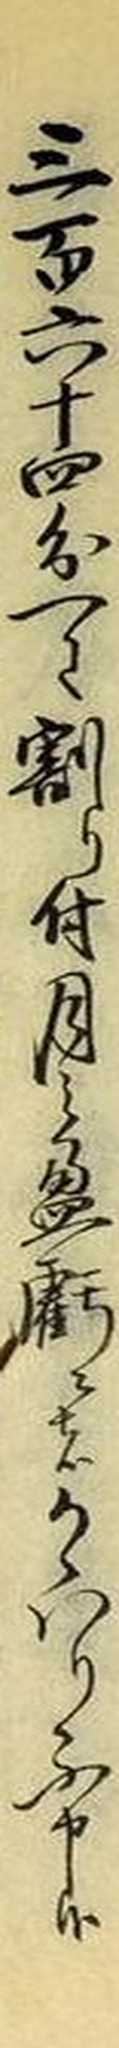三百六十四分一に割り付月之盈虧ニ者かゝハり不申候
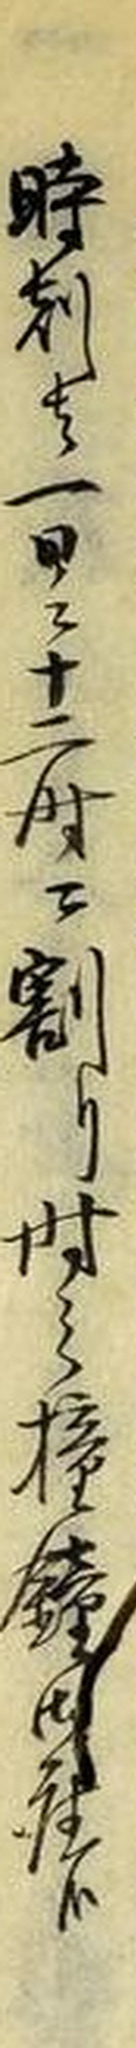時刻者一日ヲ十二時二割り時之撞鐘御座候
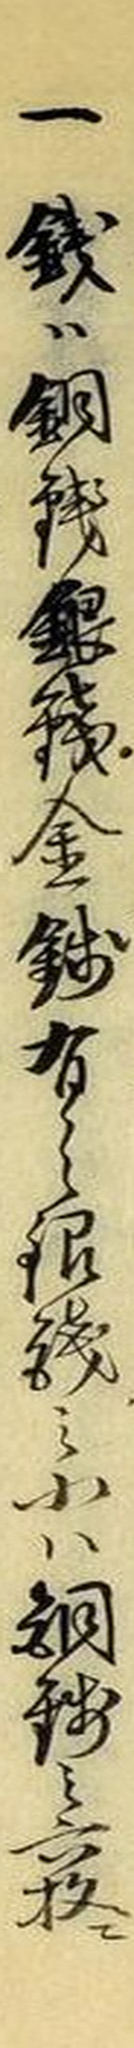一銭ハ銅銭銀銭金銭有之銀銭之小ハ銅銭之六枚ニ
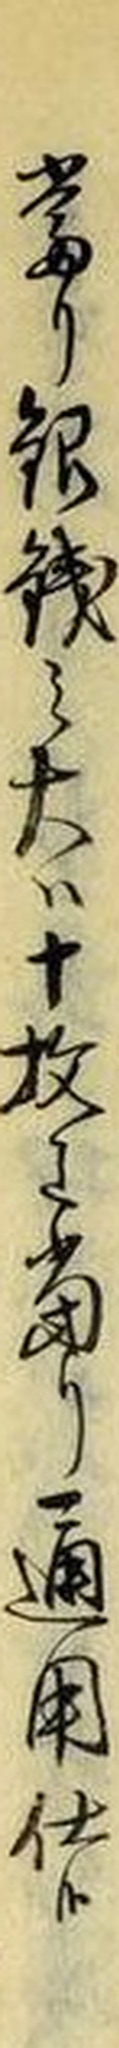当り銀銭之大ハ十枚に当り通用仕候
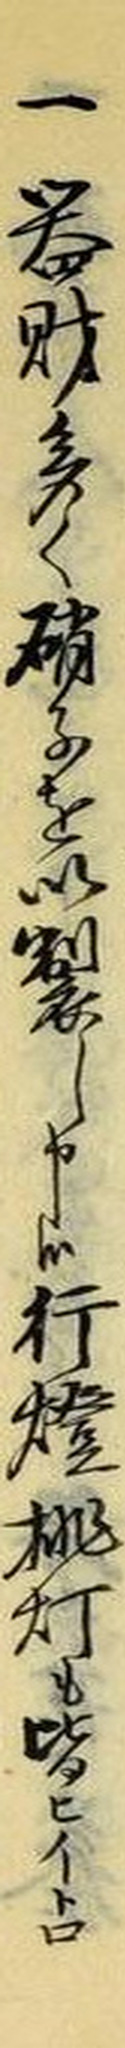一器材多く硝子を以製し申候行燈挑灯も皆ヒイトロ
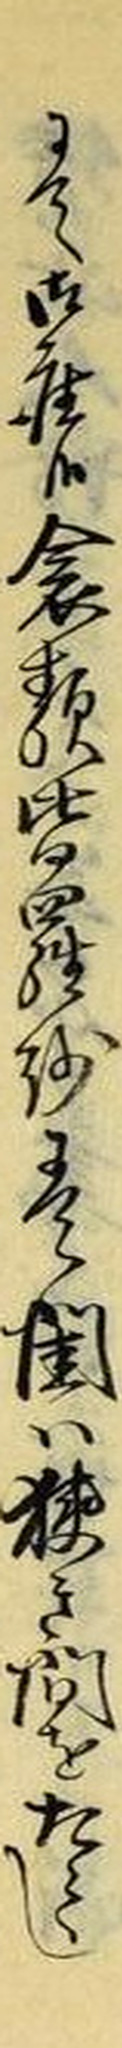にて御座候衾類皆羅紗にて閨ハ狭き間をたてし
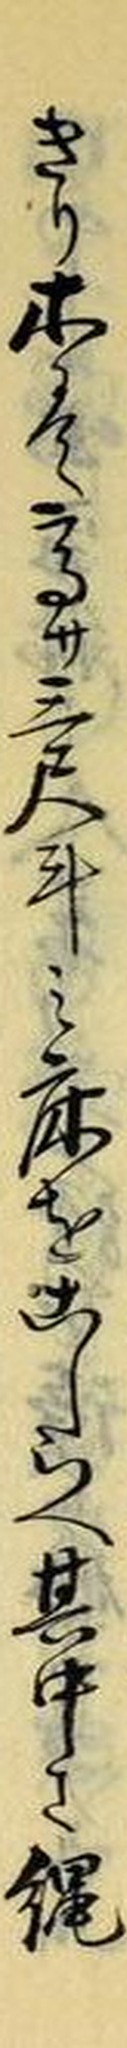きり木にて高サ三尺計之床をこしらへ其中に縄
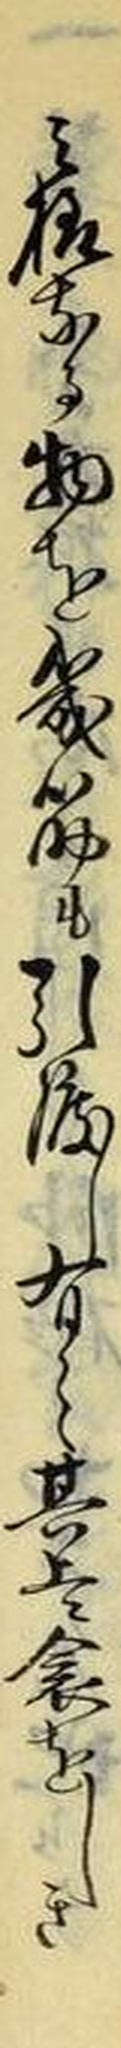の様なる物を幾筋も引渡し有之其上二衾をしき
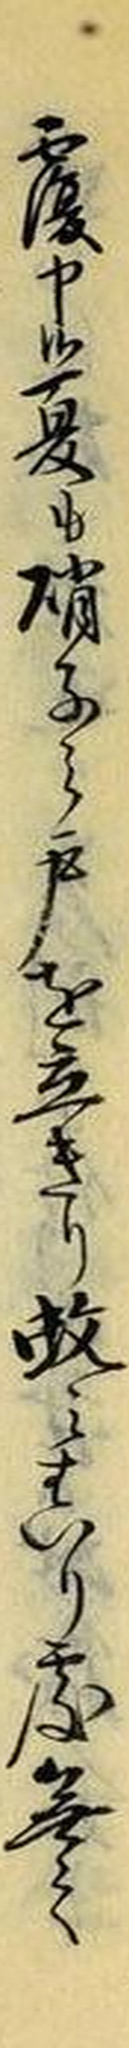覆申候夏も硝子之戸を立きり課蚊之はいり處無之
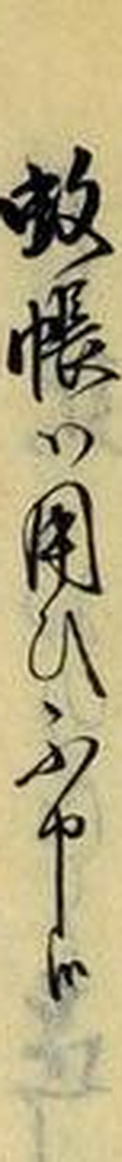蚊帳ハ用ひ不申候
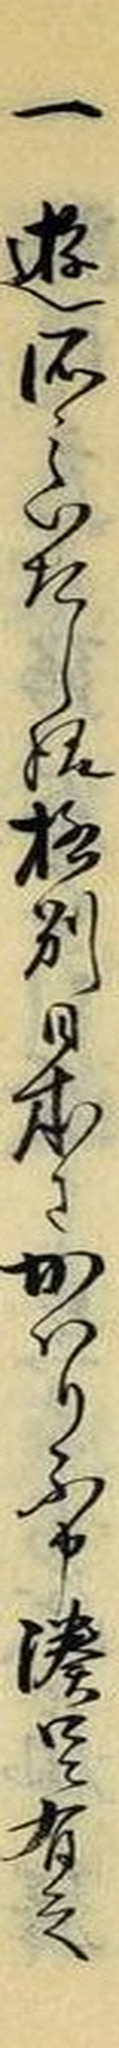一遊所之いたし様格別日本にかハり不申湊口二有之
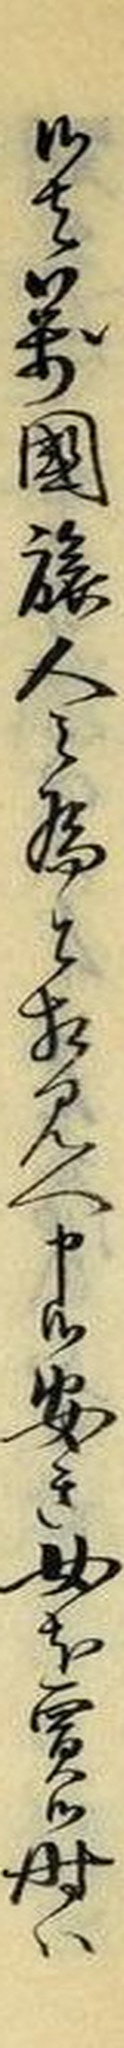候者万国旅人之為と相見へ申候安き女を買候時ハ
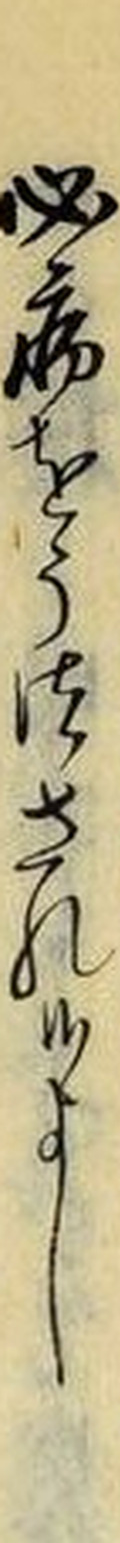必病をうつされ候よし
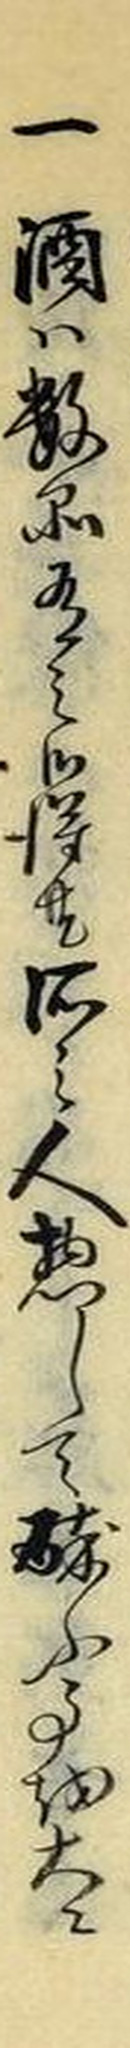一酒ハ数品有之候得共所之人惣して酔ふ事を大ニ
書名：漂客談奇（備考雑録写8）
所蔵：福井県文書館 Fukui Prefectural Archives
